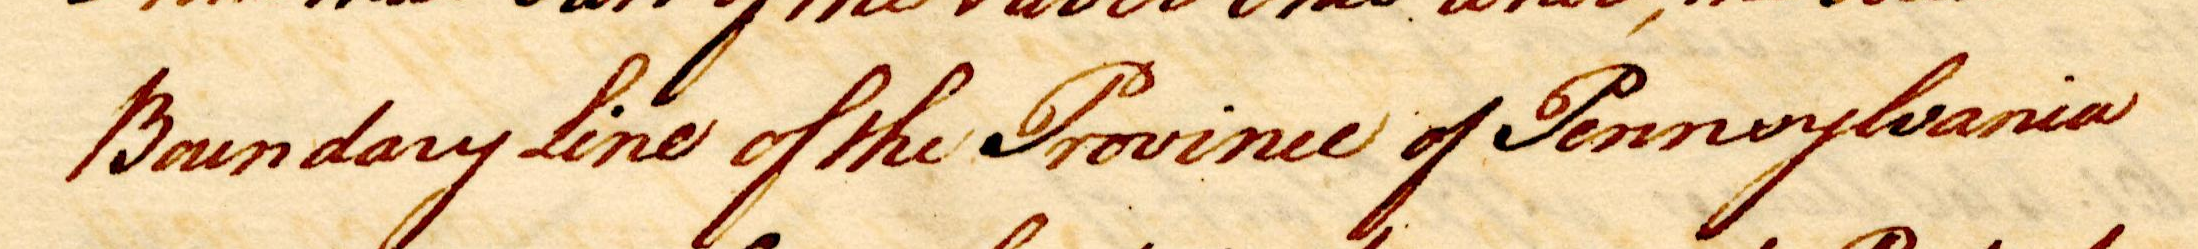Boundary Line of the Province of Pennsylvania
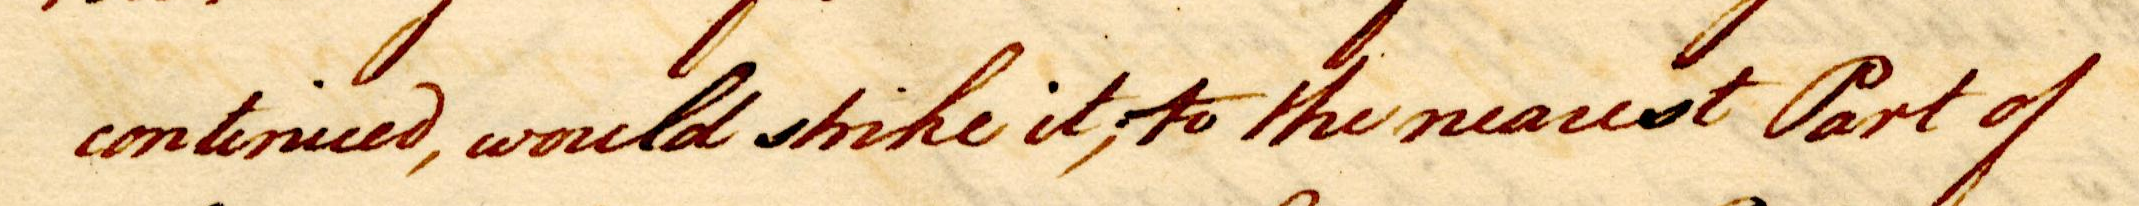continued, would strike it; to the nearest Part of
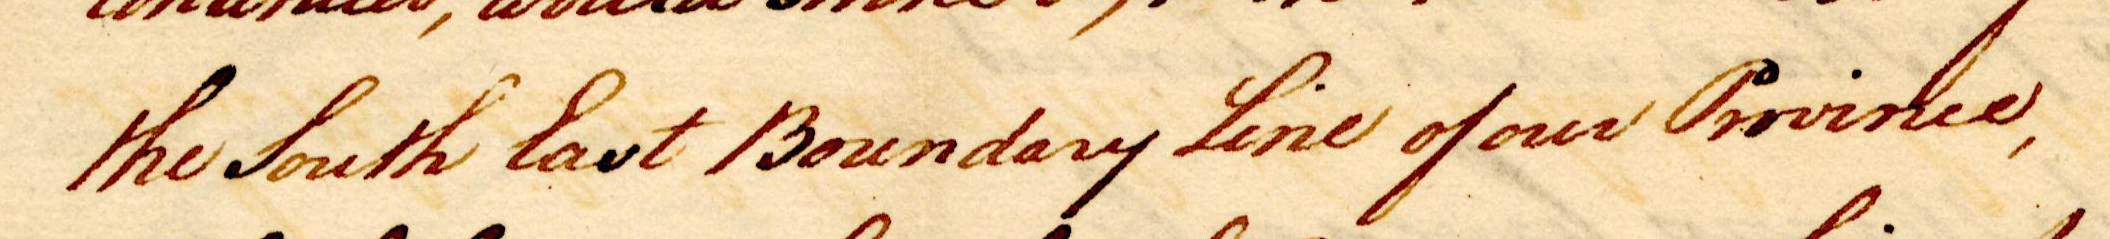the South East Boundary line of our Province
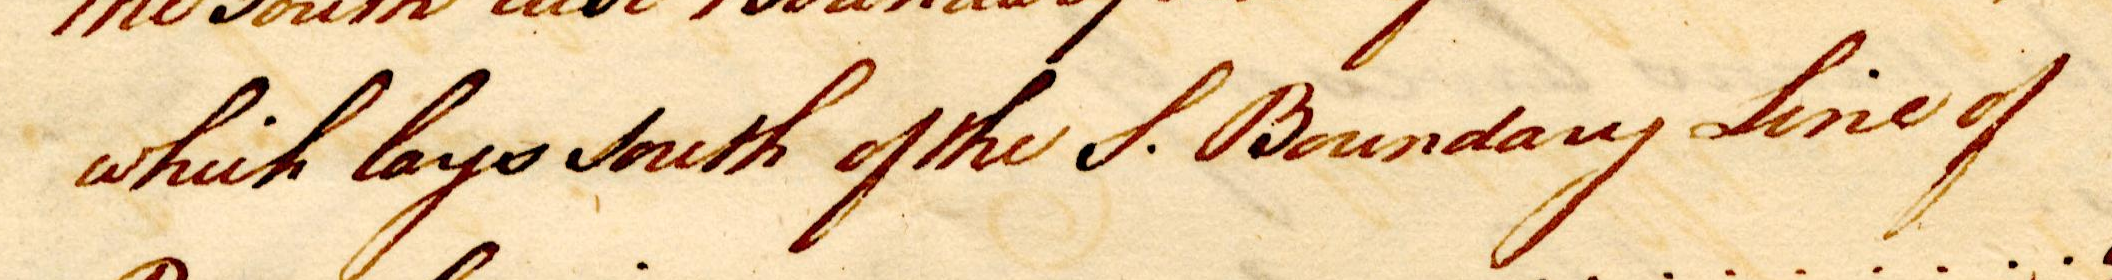which lays south of the S. Boundary Line of
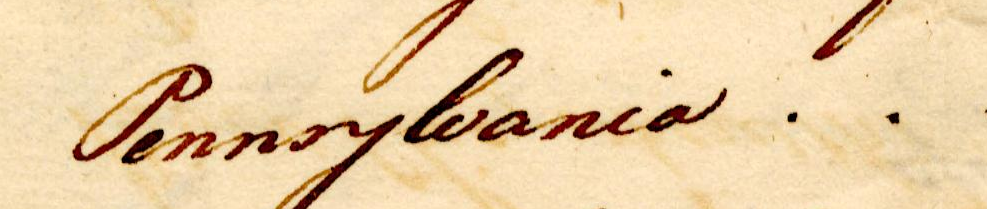Pennsylvania..
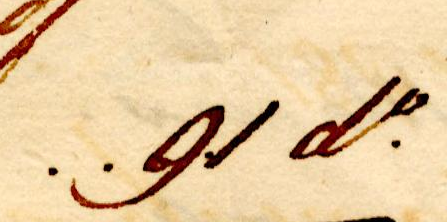91 D^o
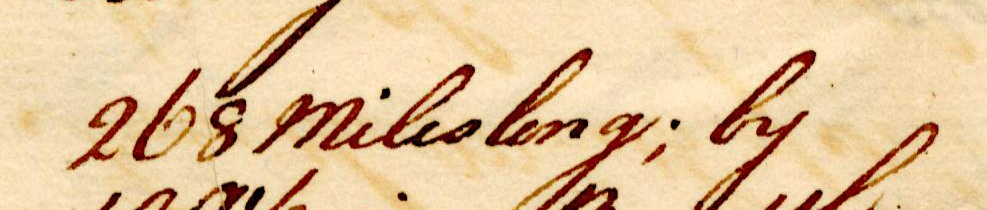268 miles long; by
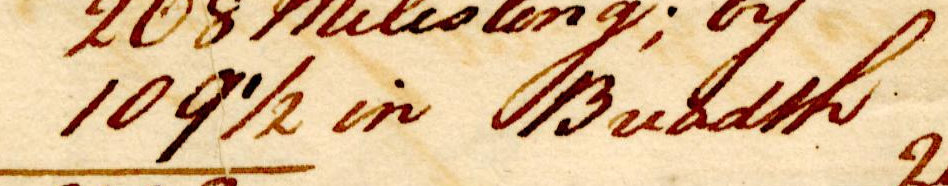109 1/2 in Breadth
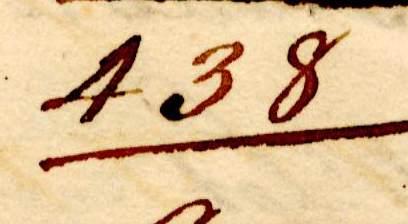438
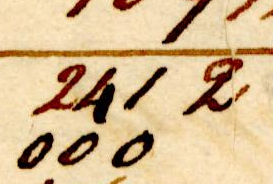2412
